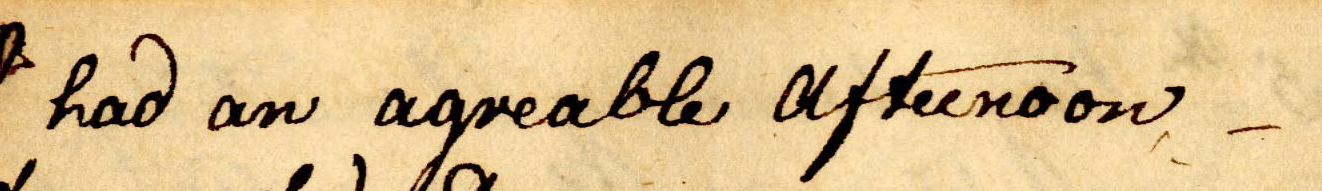had an agreable Afternoon -
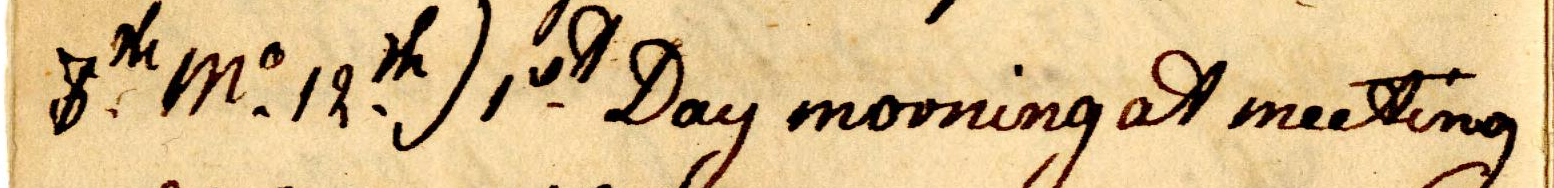7^th M^o 12^th ) 1^st Day morning at meeting
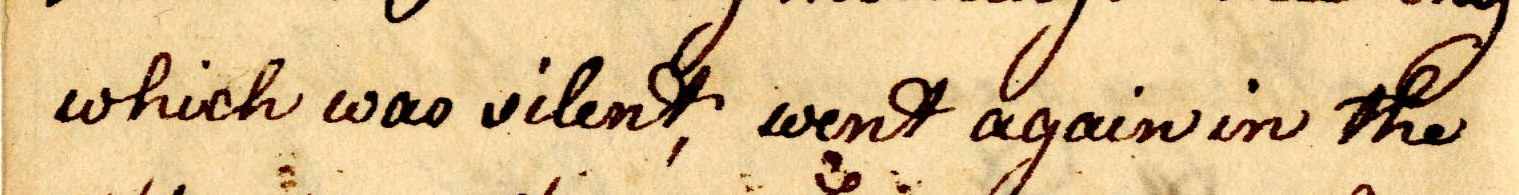which was silent, went again in the
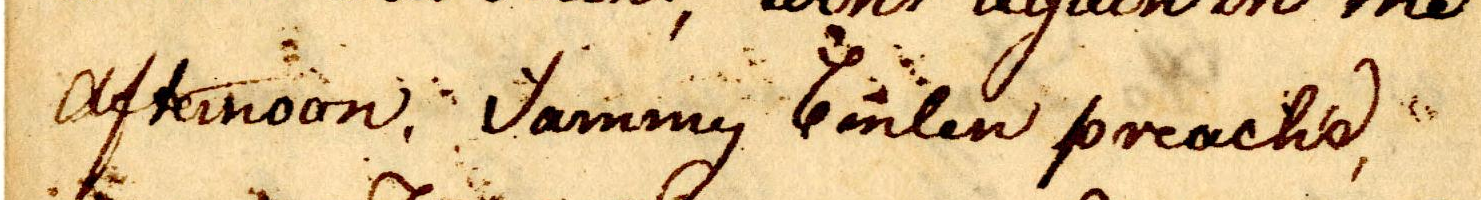Afternoon, Sammy Emlen preach'd,
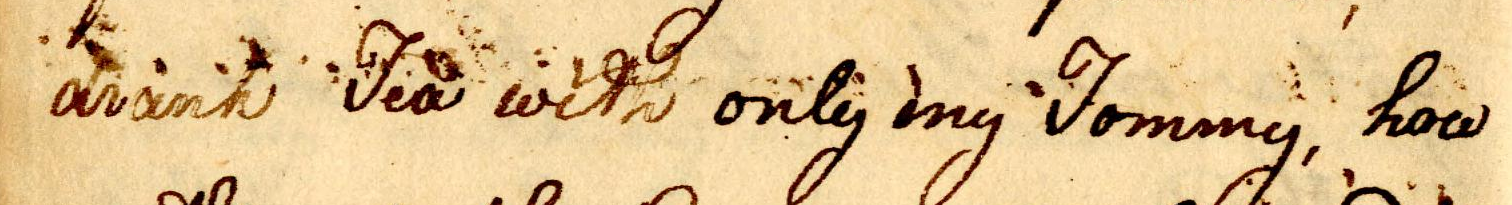drank Tea with only my Tommy, how
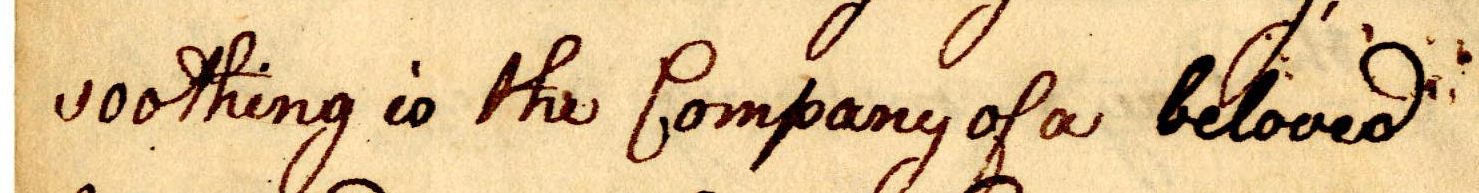soothing is the Company of a beloved
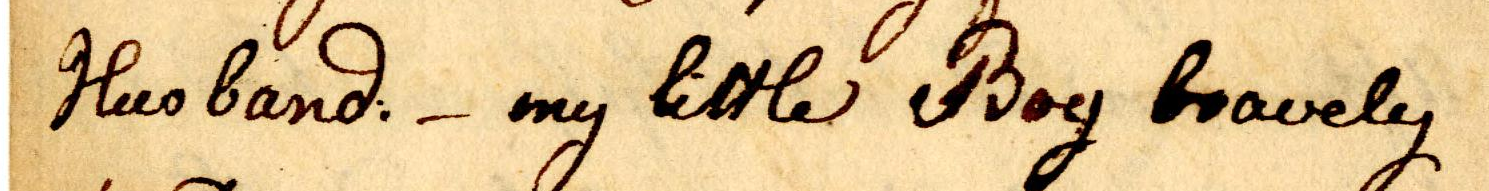Husband.- my little Boy bravely
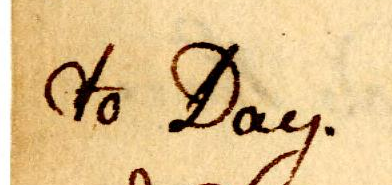to Day.
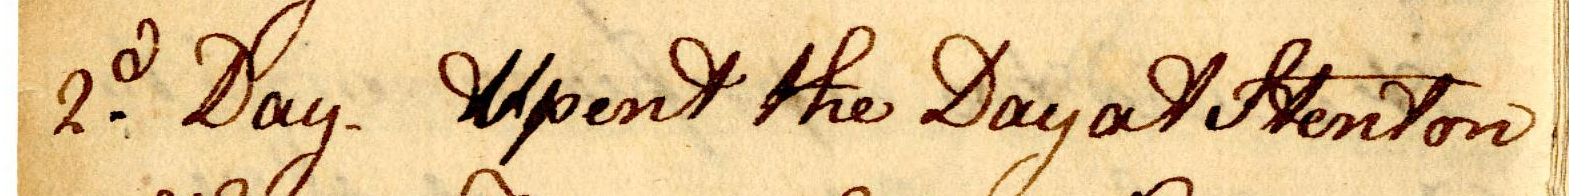2^d. Day. spent the Day at Stenton
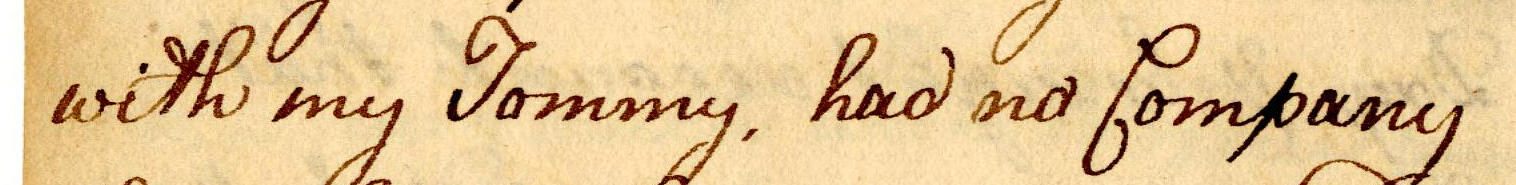with my Tommy, had no Company
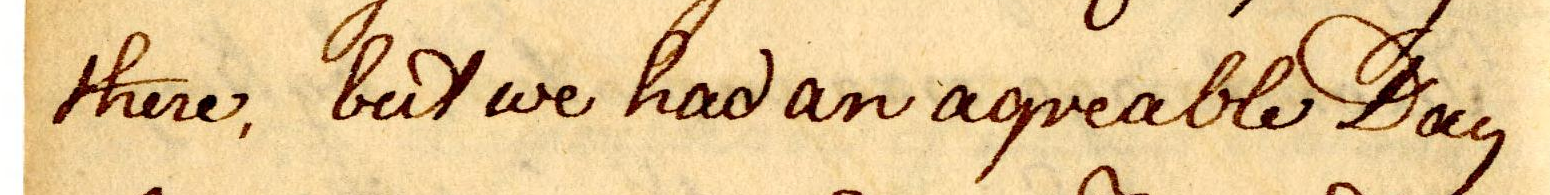there, but we had an agreable Day
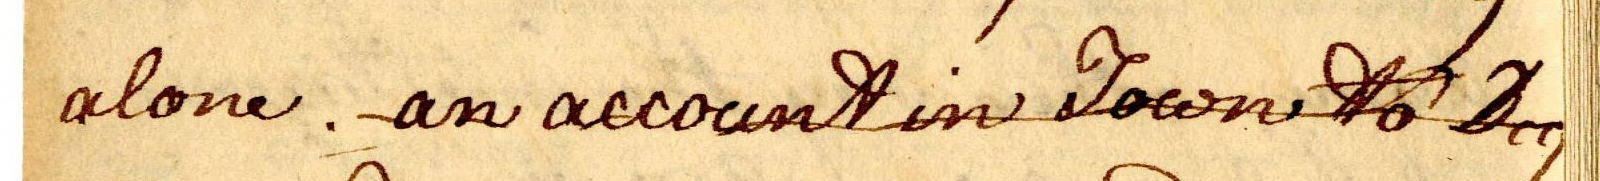alone. an account in Town to Day
